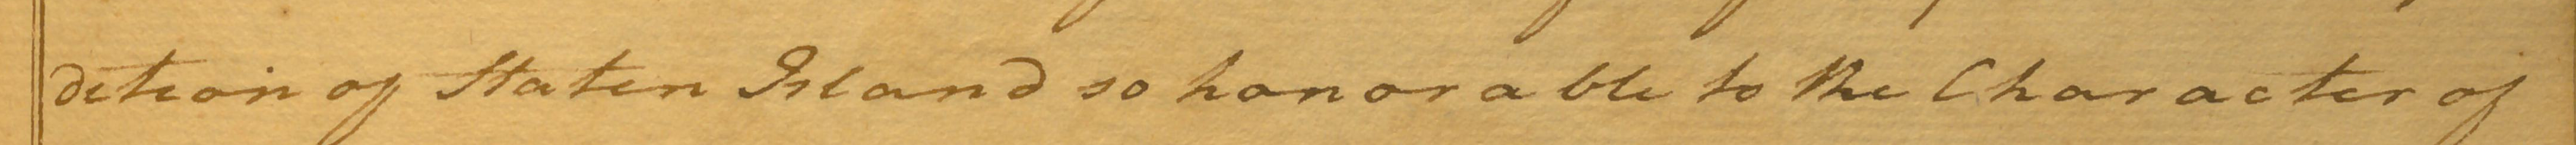dition of Staten Island so honourable to the Character of
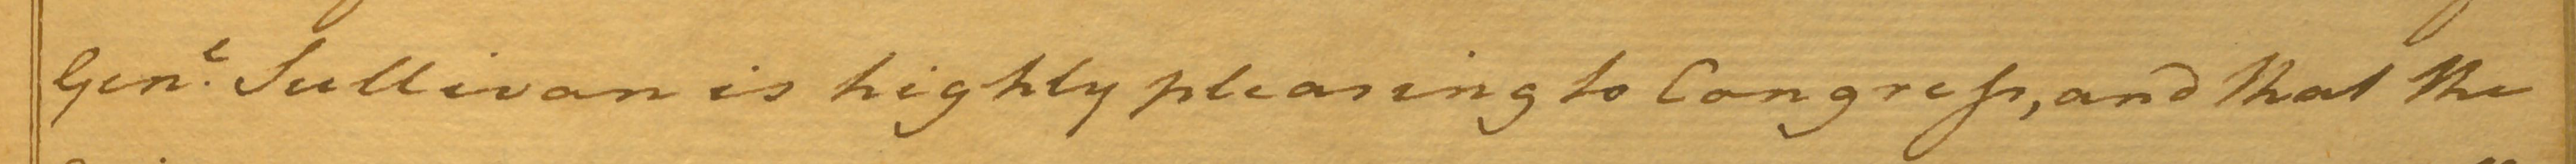Gen^l. Sullivan is highly pleasing to Congress, and that the
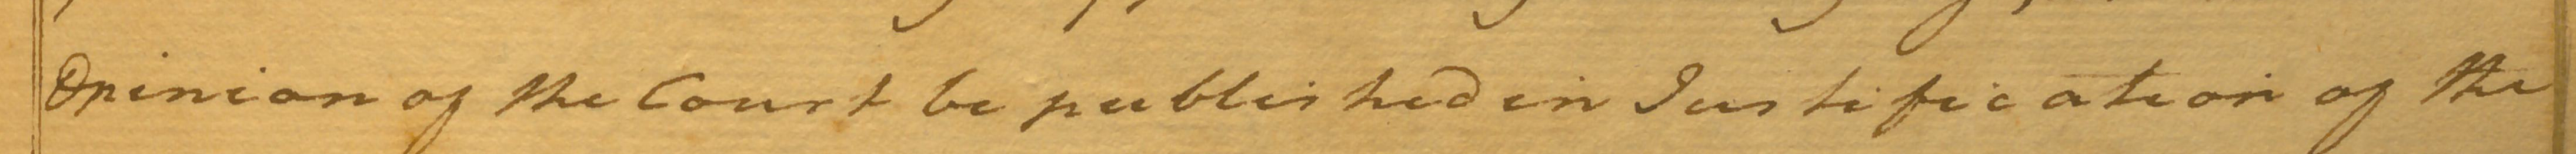Opinion of the Court be published in Justification of the
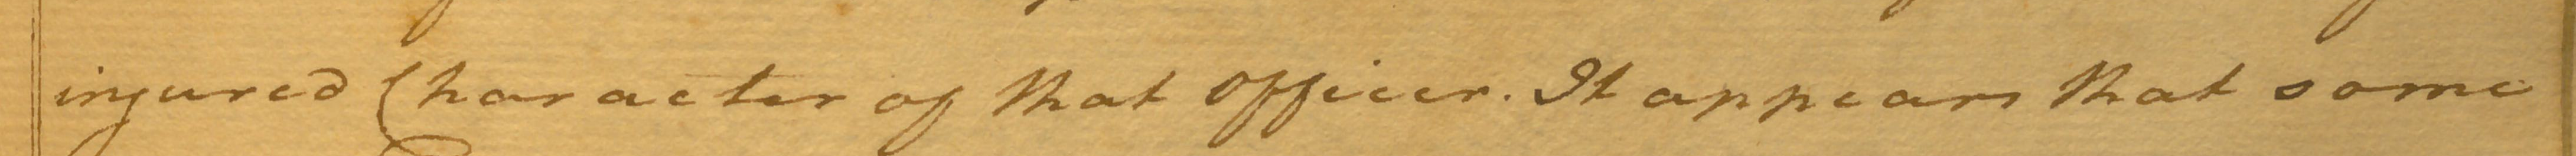injured Character of that officer. It appears that some
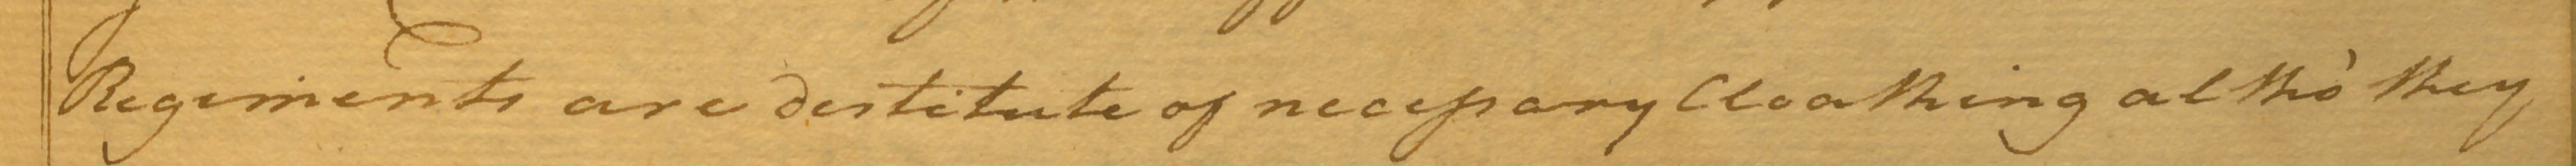Regiments are destitute of necessary Cloathing altho' they
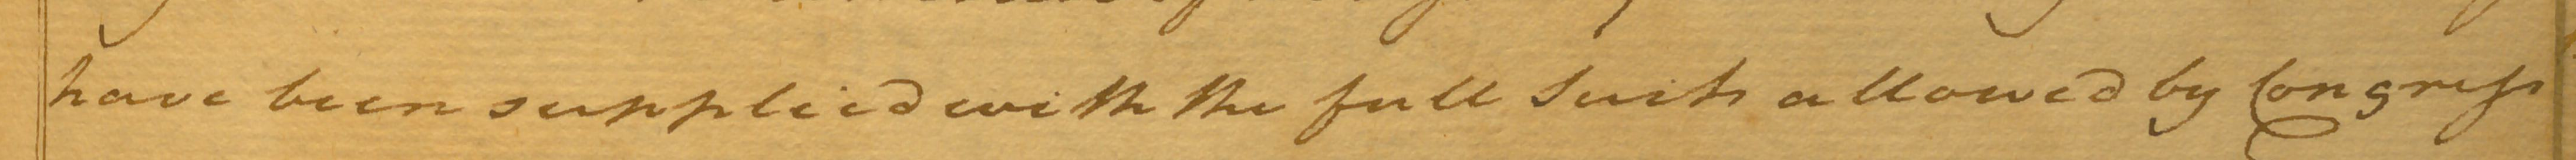have been supplied with the full suits allowed by Congress
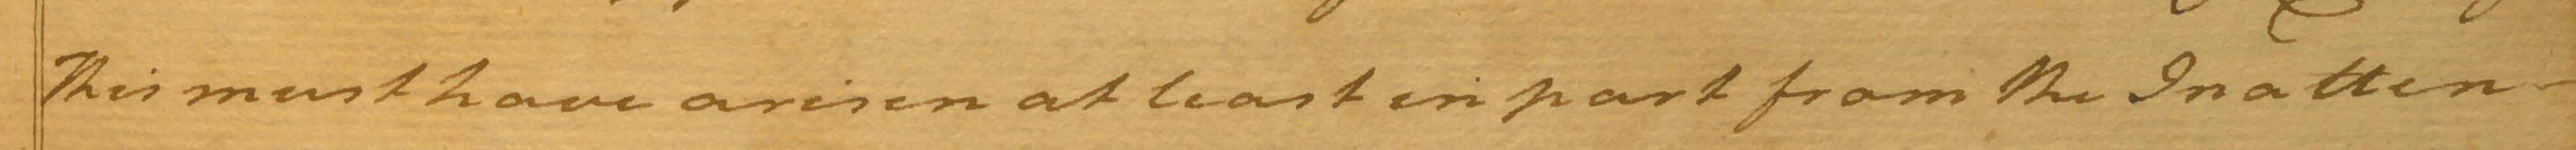This must have arisen at least in part from the Inatten-
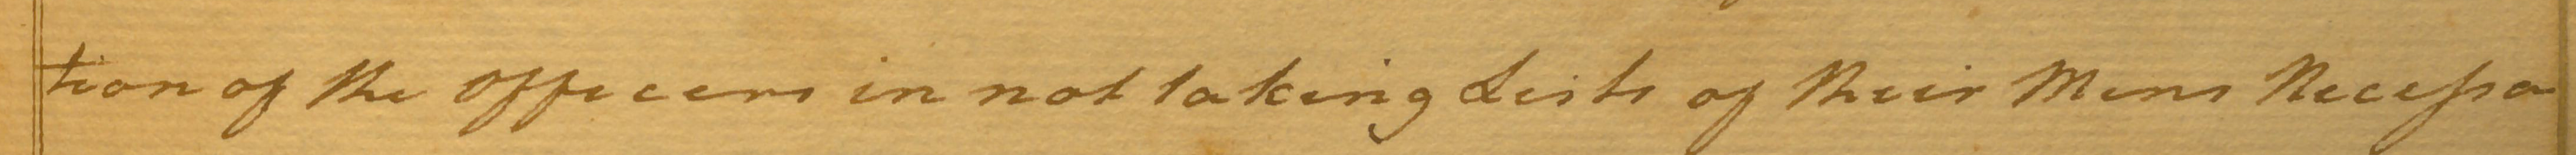tion of the Officers in not taking Lists of their Mens Necessa
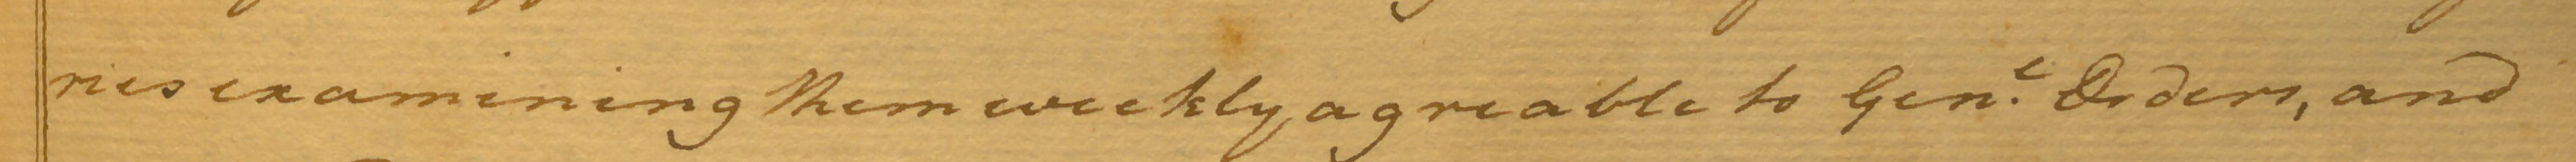ries examining them weekly agreable to Gen^l. Orders, and
